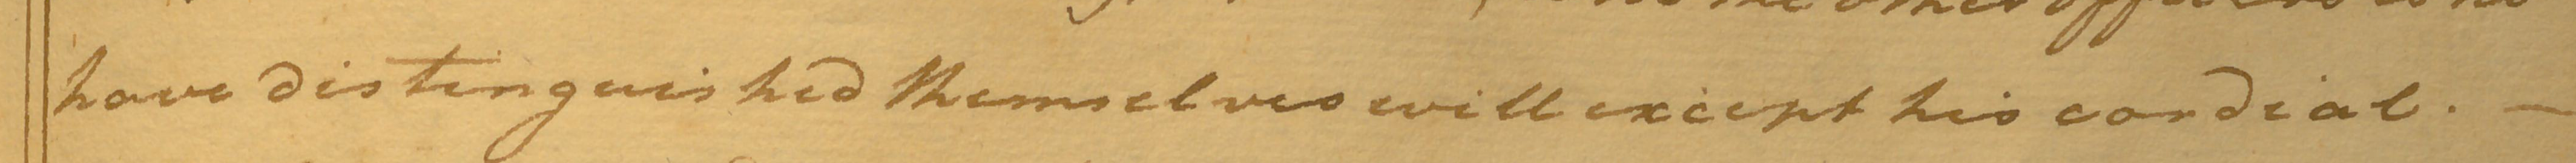have distinguished themselves will except his cordial
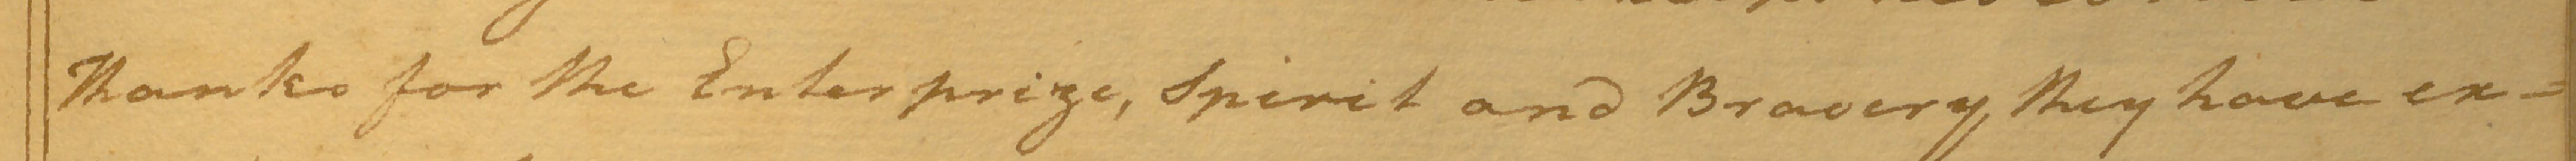Thanks for the Enterprize, spirit and Bravery they have ex-
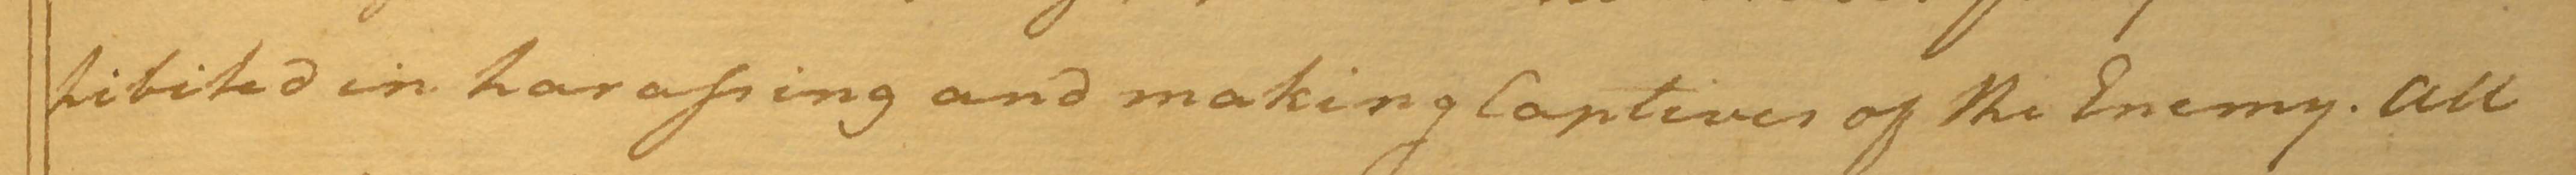hibited in harassing and making Captives of the Enemy. All
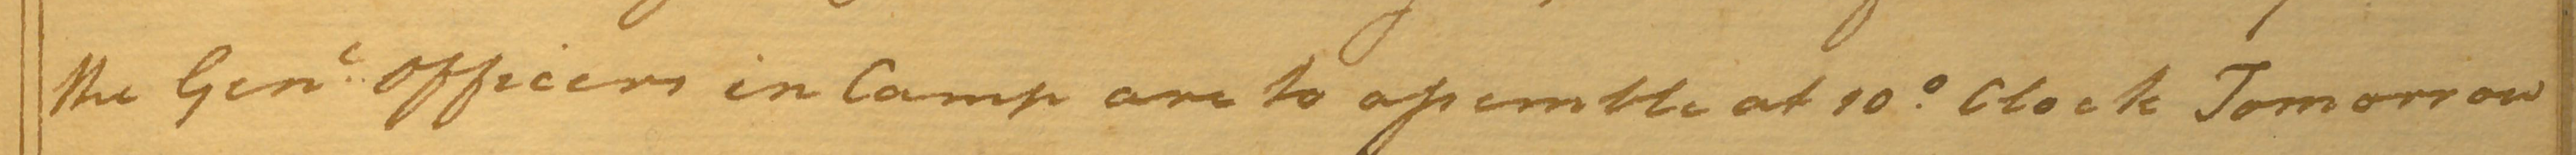the Gen^l. Officers in Camp are to assemble at 10. ^oClock Tomorrow
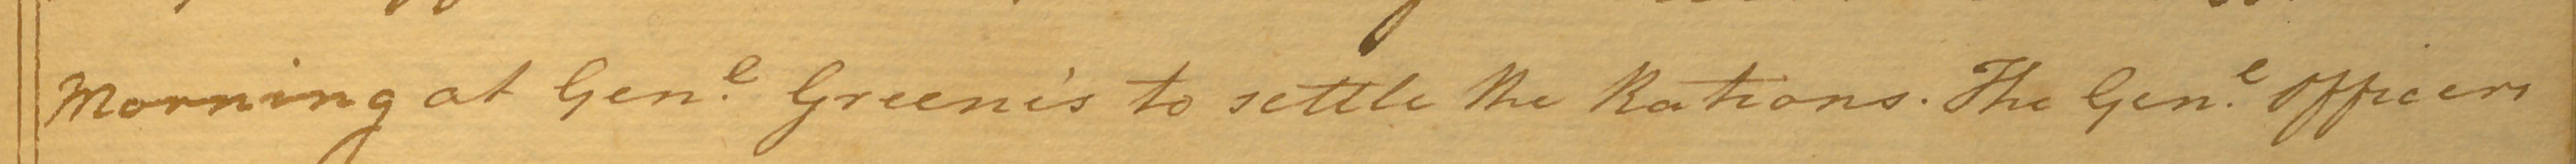morning at Gen^l. Greene's to settle the Rations. The Gen^l. officers
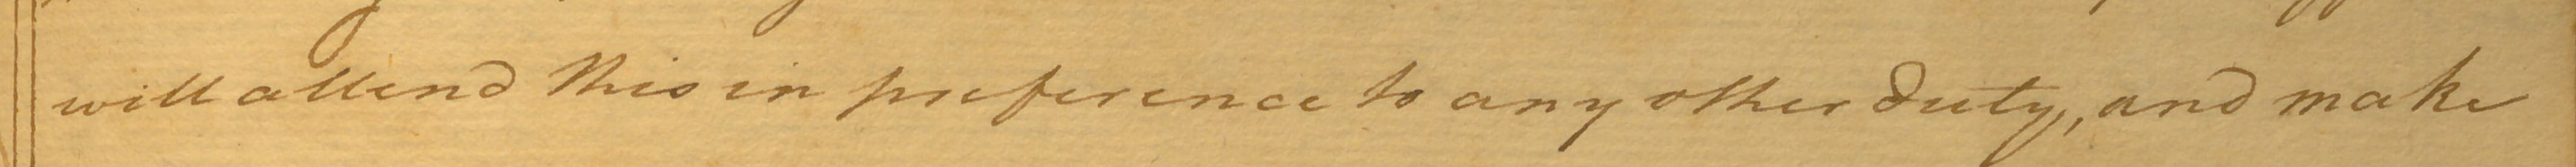will attend this in preference to any other duty, and make
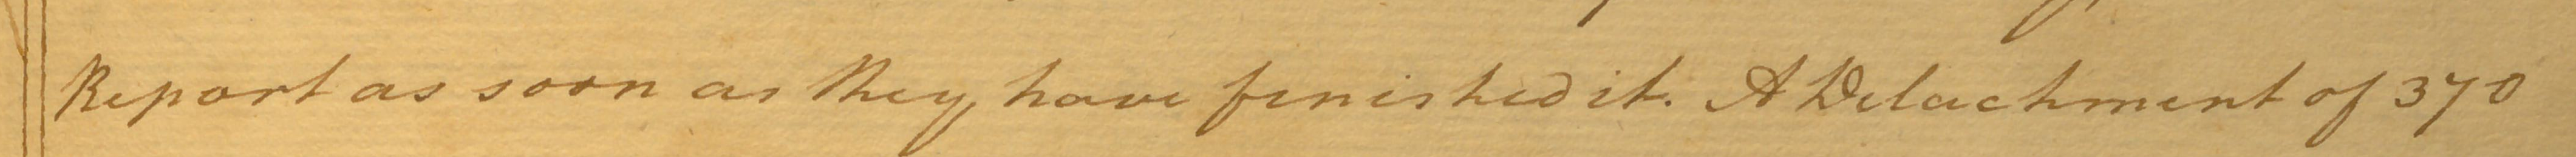Report as soon as they have finished it. A Detachment of 370
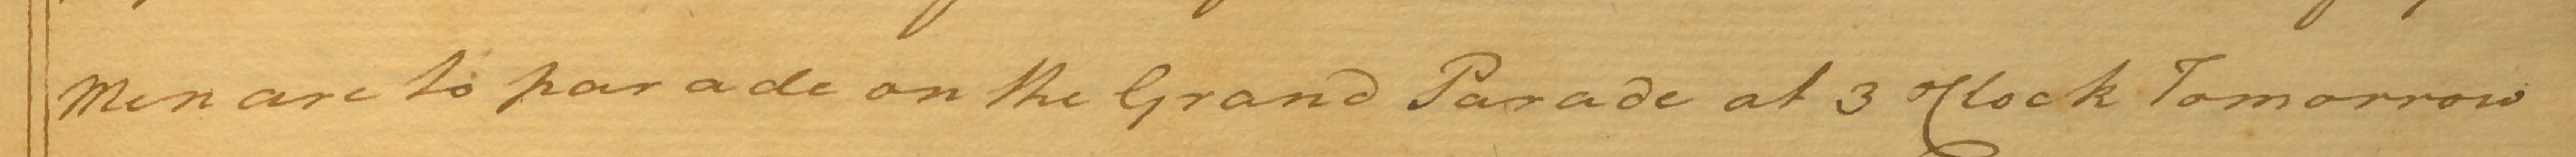men are to parade on the Grand Parade at 3 oClock Tomorrow
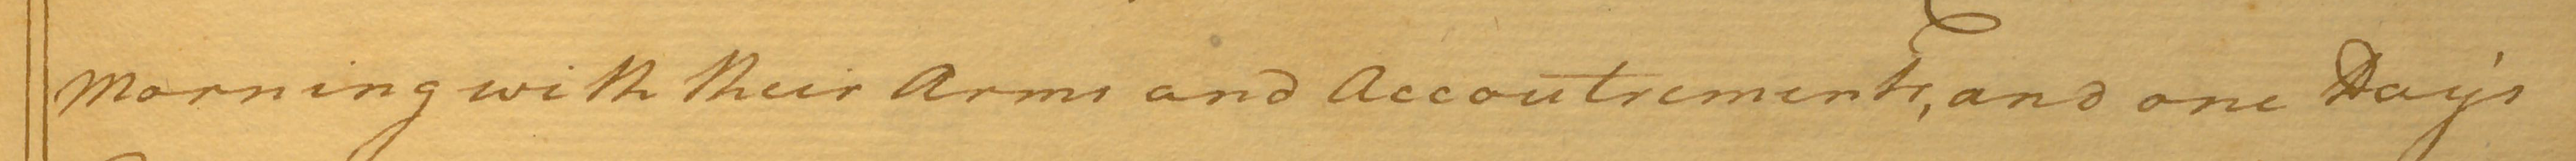morning with their Arms and Accoutrements, and one Day's
